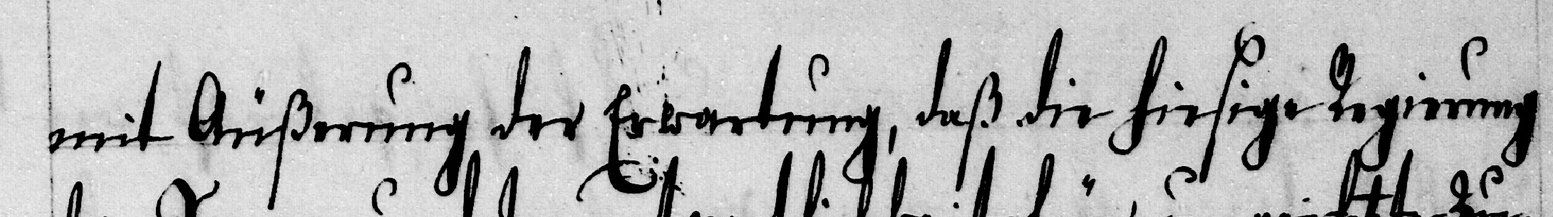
mit Äußerung der Erwartung, daß die hiesige Regierung
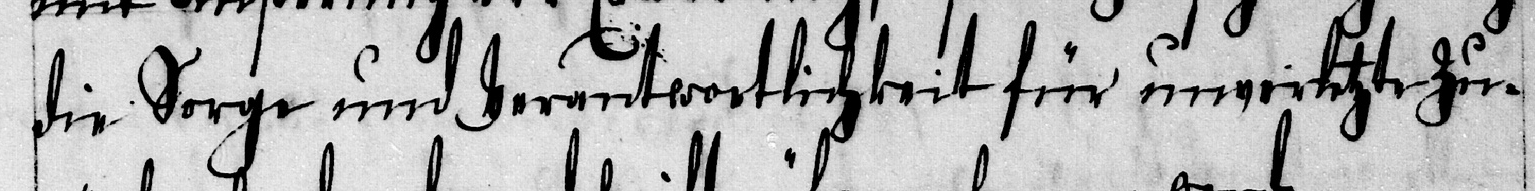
die Sorge und Verantwortlichkeit für unverletzte Zu¬
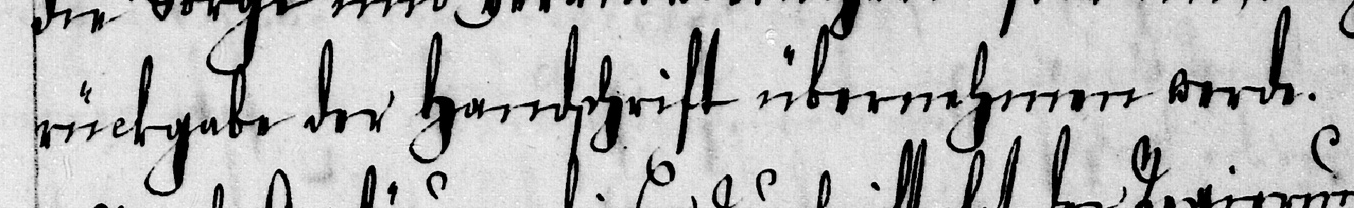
rückgabe der Handschrift übernehmen werde.
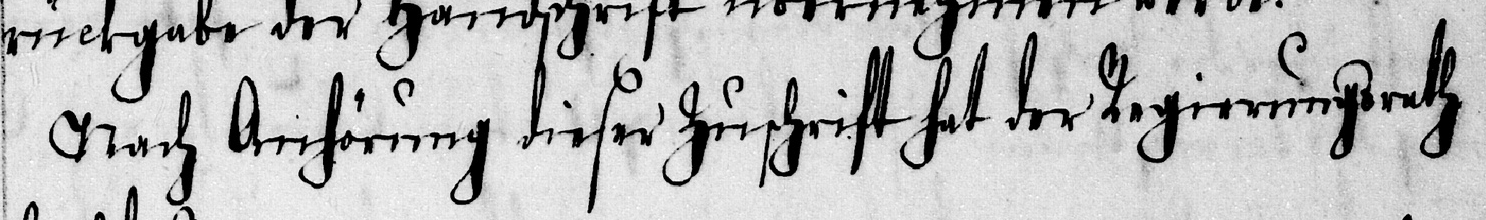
Nach Anhörung dieser Zuschrift hat der Regierungsrath
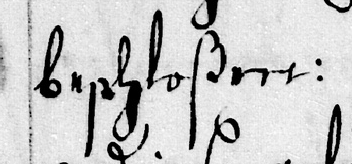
beschloßen:
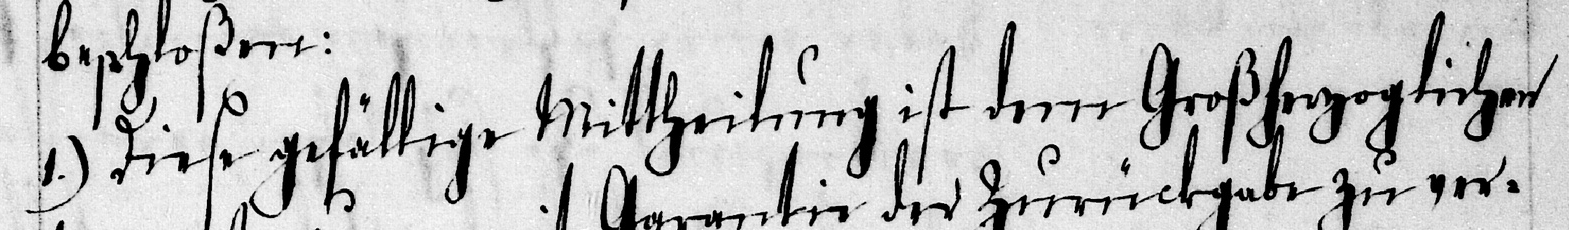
1.) Diese gefällige Mittheilung ist dem Großherzoglichen
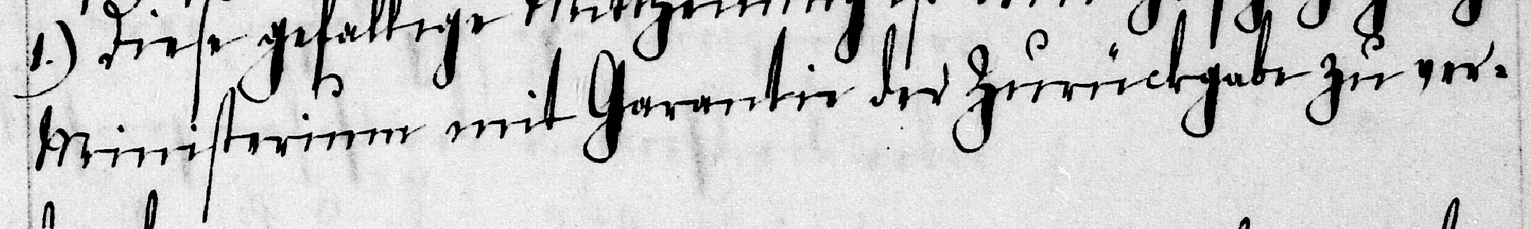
Ministerium mit Garantie der Zurückgabe zu ver¬
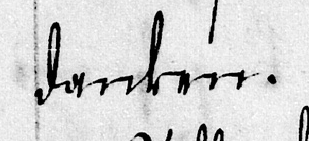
danken.
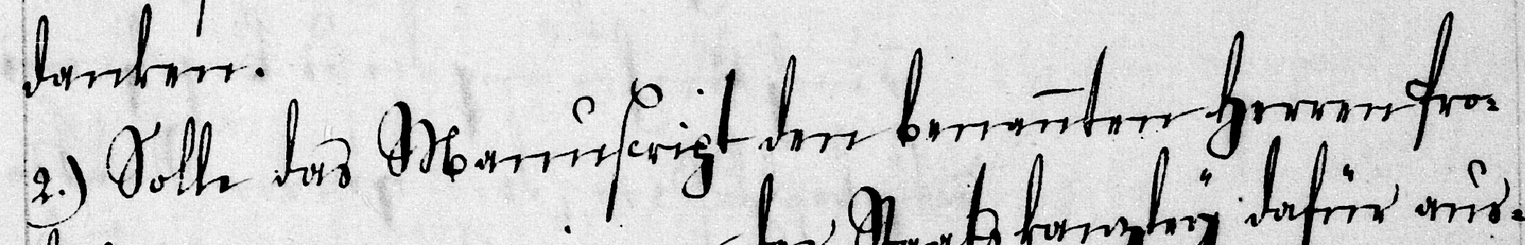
2.) Solle das Manuscript den benannten Herren Pro¬
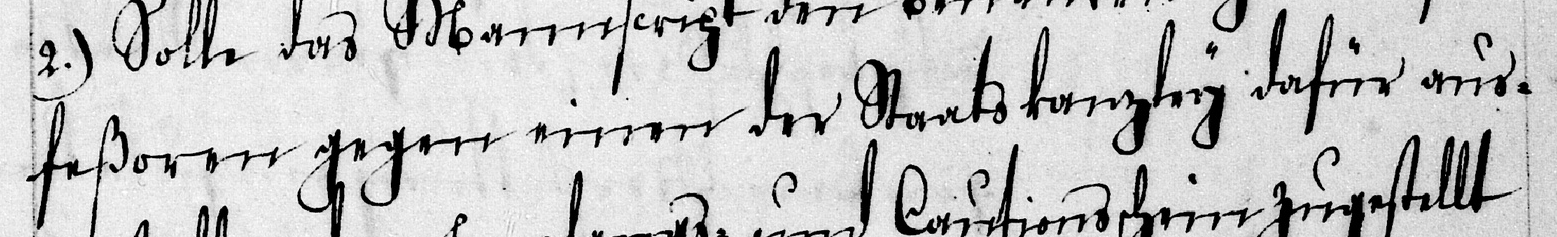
feßoren gegen einen der Staatskanzley dafür aus¬
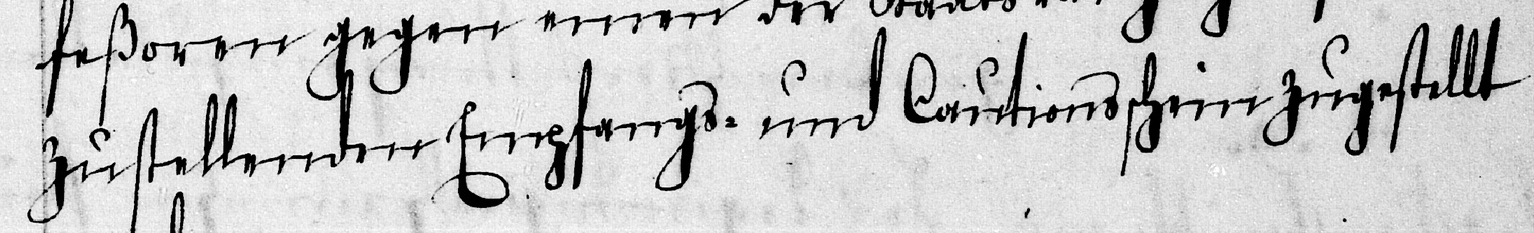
zustellenden Empfangs- und Cautionsschein zugestellt
